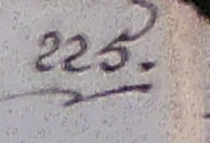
225.
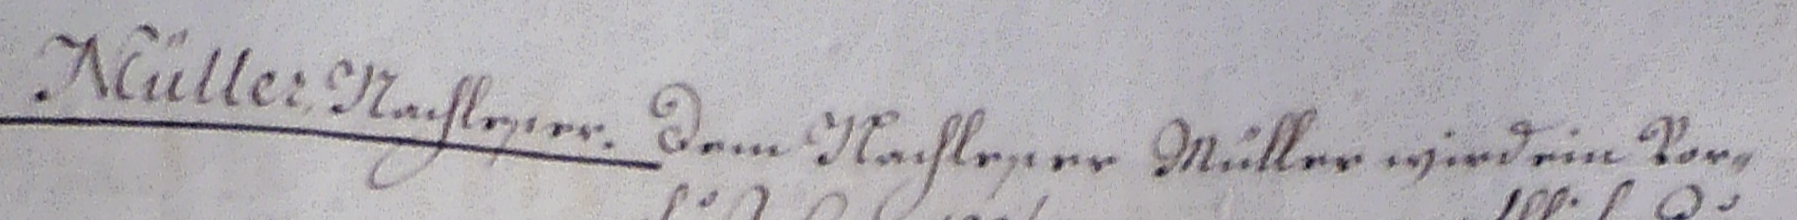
Müller, Nachleser. Dem Nachleser Müller wird ein Vor¬
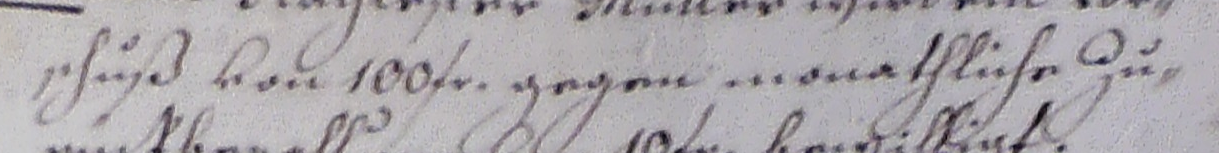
schuß von 100fr. gegen monathliche Zu¬
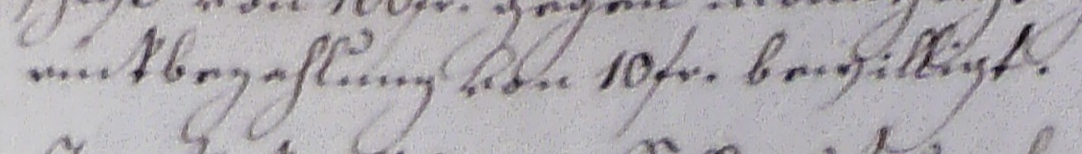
rückbezahling von 10fr. bewilligt.
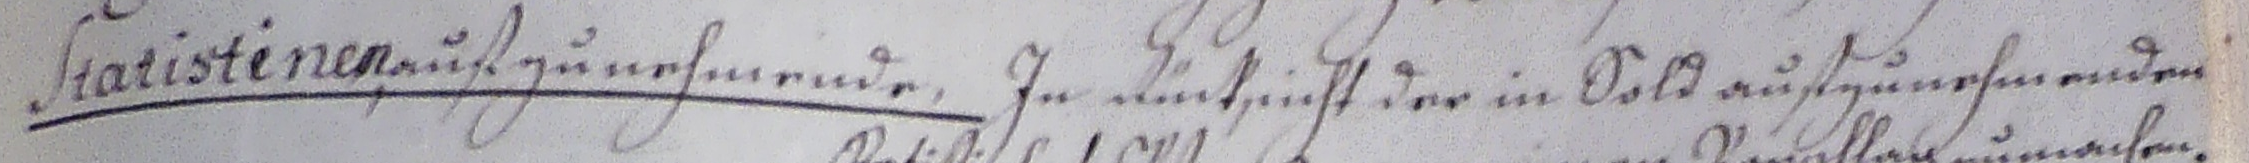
Statistinen, aufzunehmende, In Rücksicht der in Sold aufzunehmenden
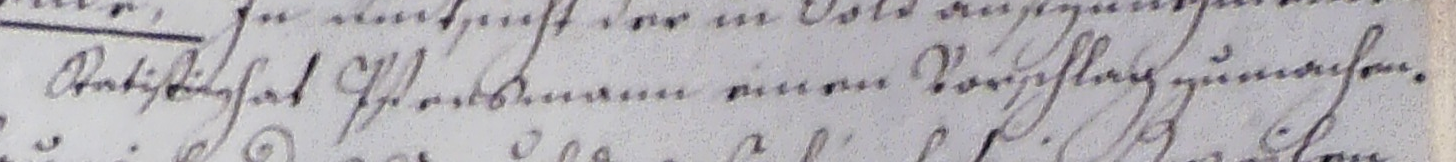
Statistinen hat Pfersmann einen Vorschlag zumachen.
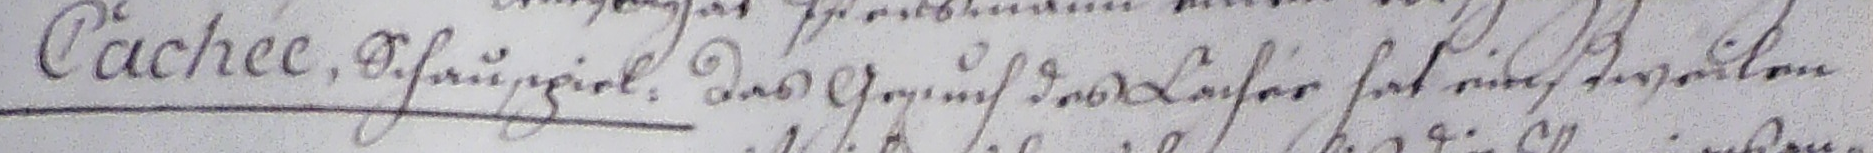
Cachée, Schauspiel: Das Gesuch des Cachée hat einstweilen
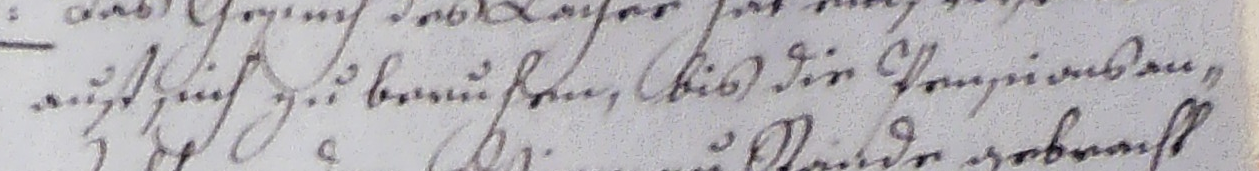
auf sich zu beruhen, bis die Pensionsan¬
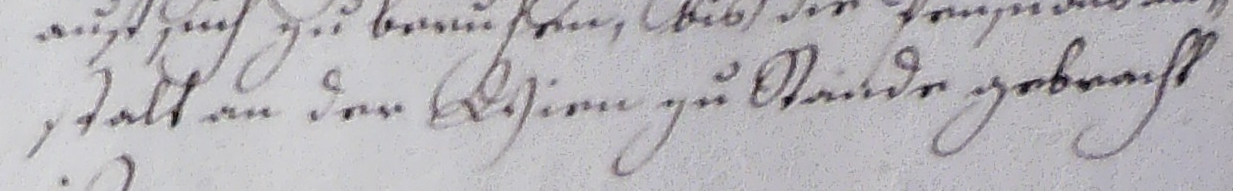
stalt an der Wien zu Stande gebracht
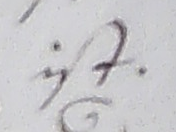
ist.
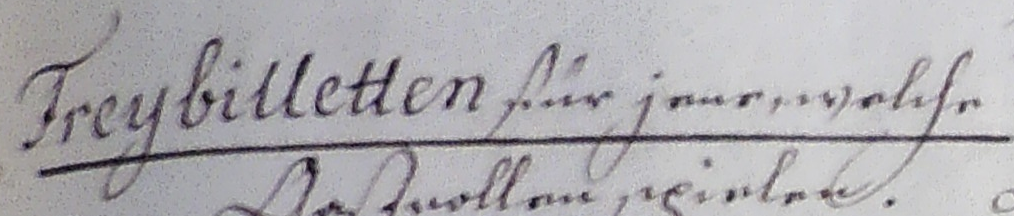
Freybilletten für jene, welche
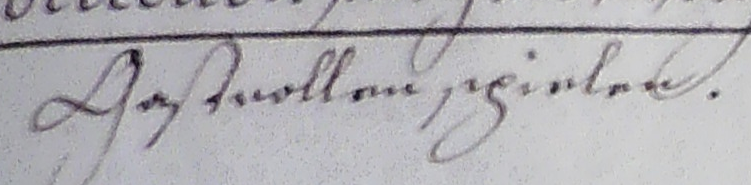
Gastrollen, spielen.
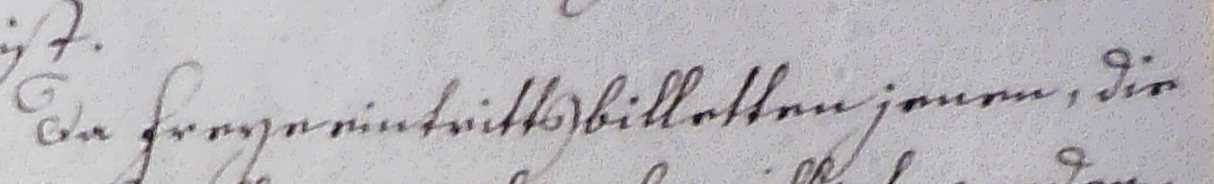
Da Freyeeintrittsbilletten jenen, die
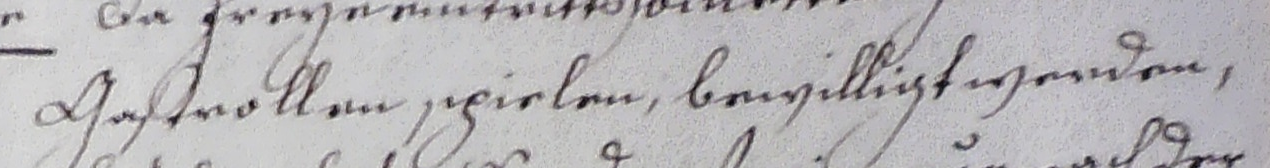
Gastrollen spielen, bewilligt werden,
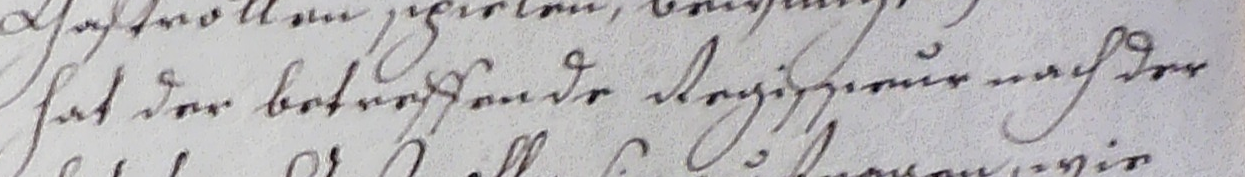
hat der betreffende Regisseur nach der
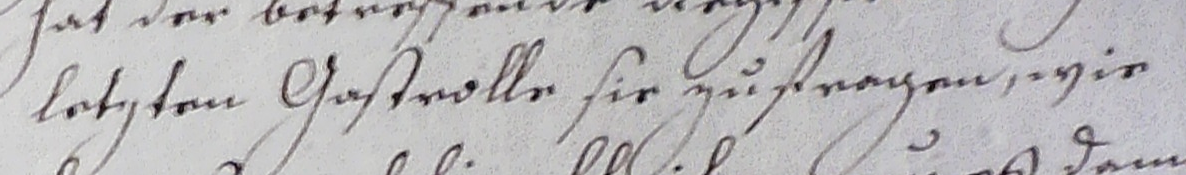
letzten Gastrolle sie zu fragen, wie
